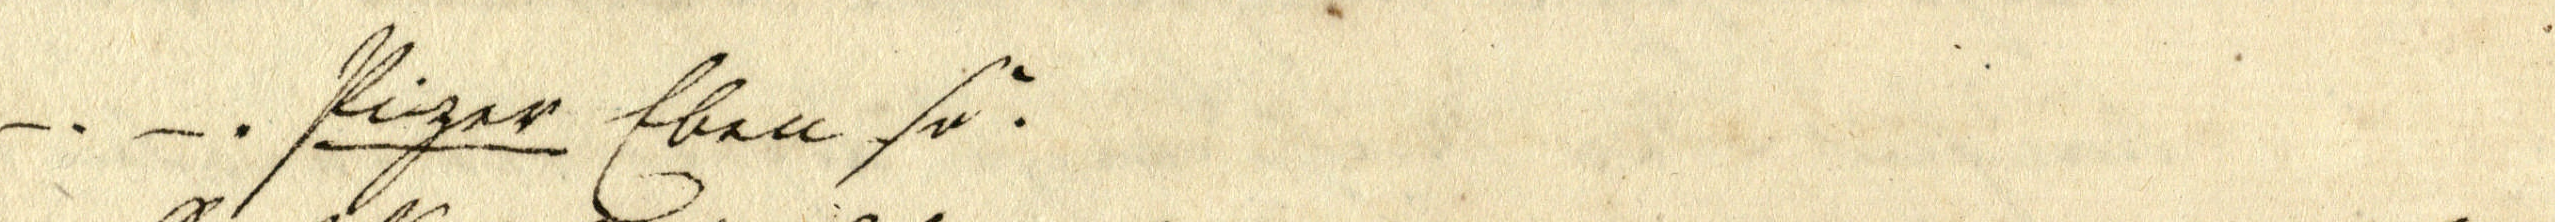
Piper Eben so.
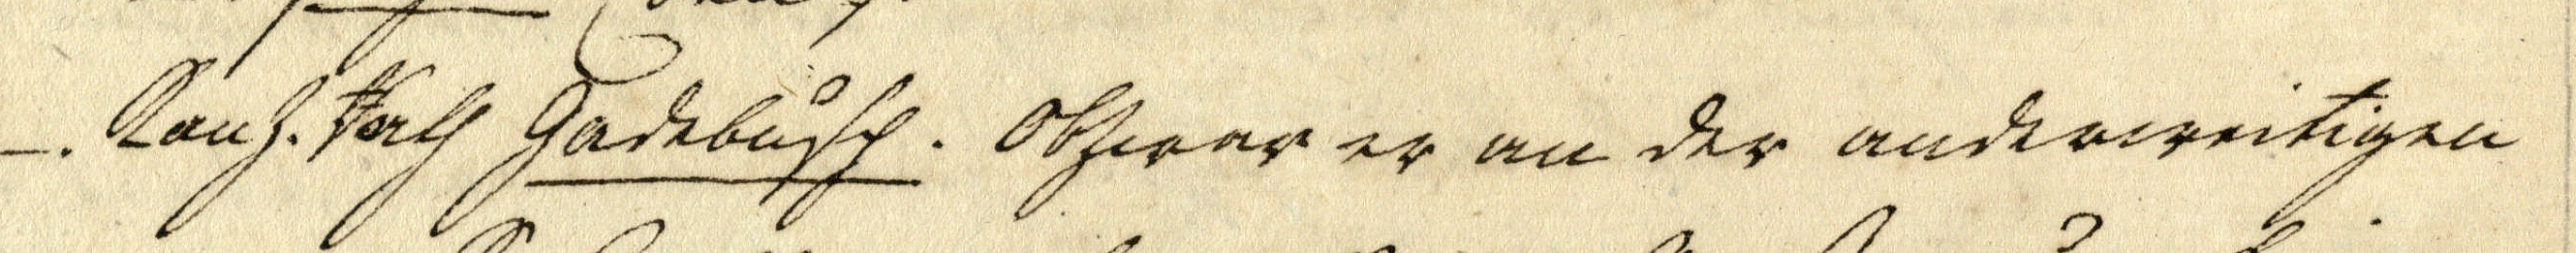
Kanz. Rath Gadebusch. Obzwar er an der anderweitigen
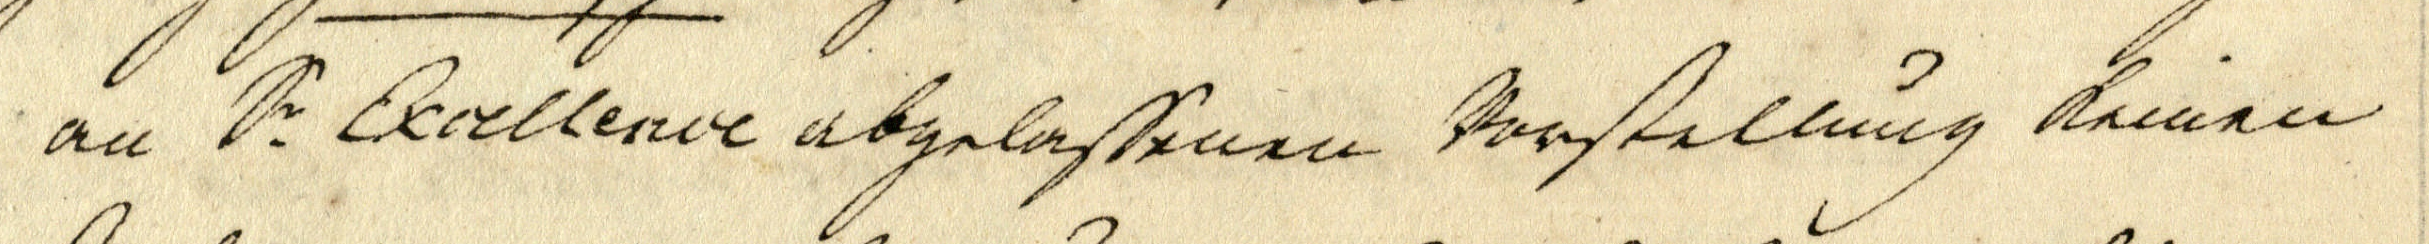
an Sr. Excellence abgelassenen Vorstellung keinen
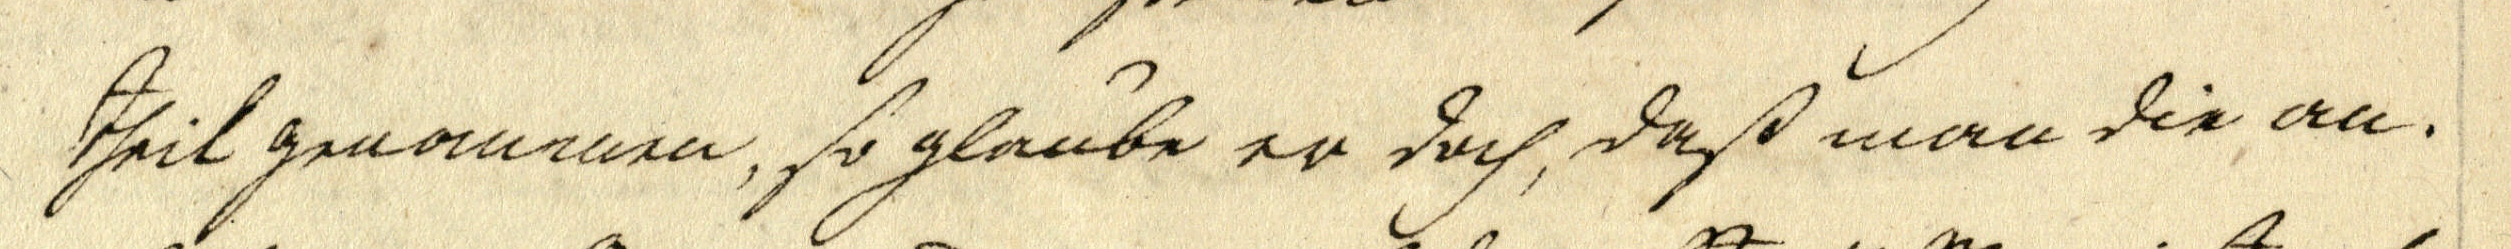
Theil genommen, so glaube er doch, daß man die an¬
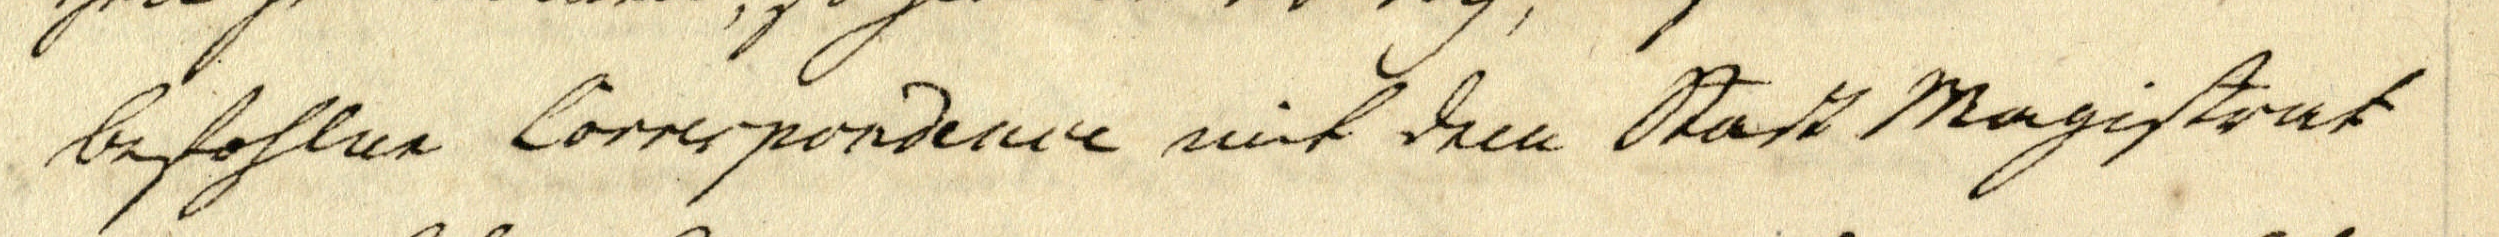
befohlene Correspondence mit dem Stadt Magistrat
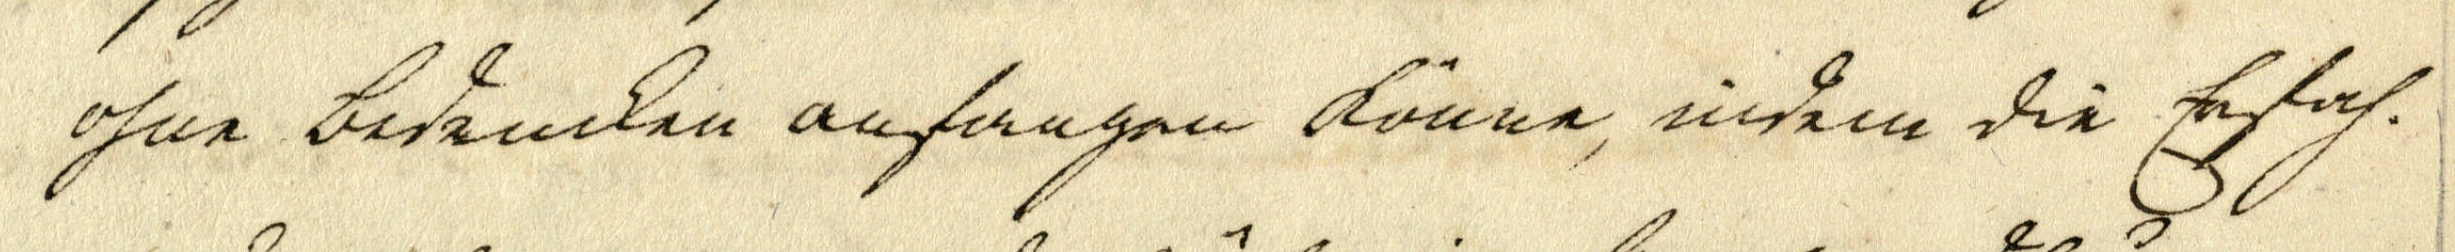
ohne Bedencken anfangen könne, indem die Erfah¬
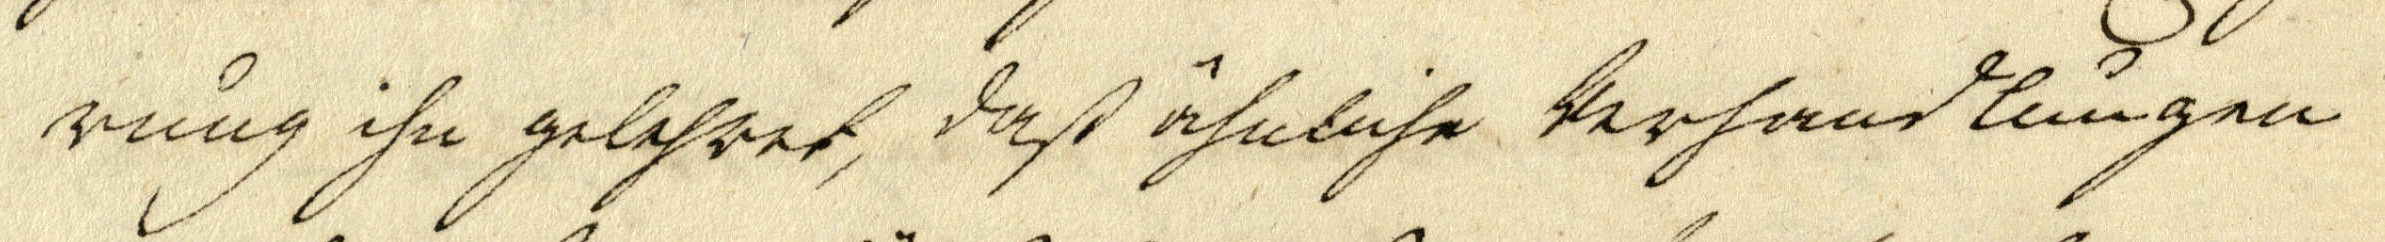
rung ihn gelehret, daß ähnliche Verhandlungen
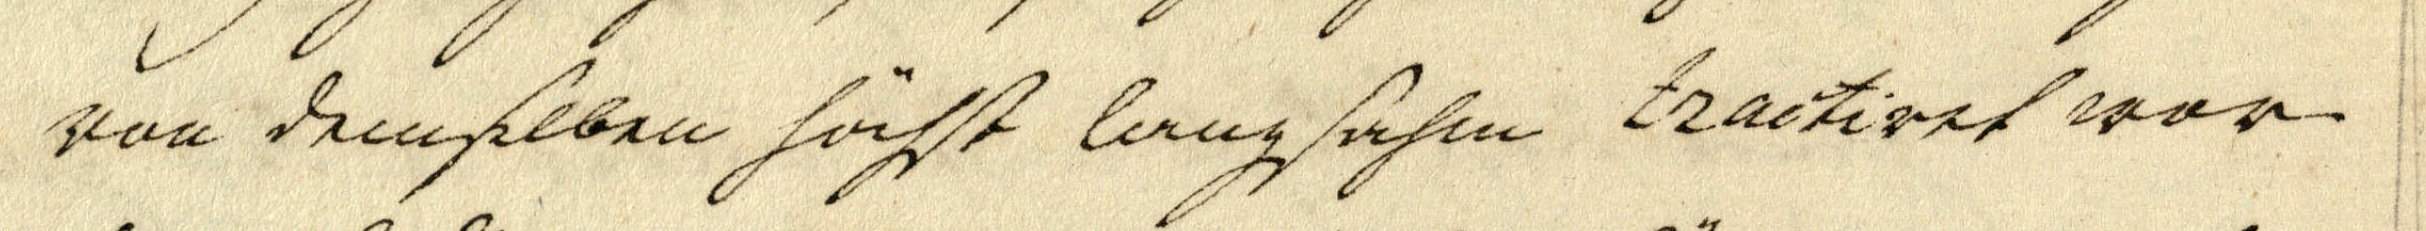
von demselben höchst langsahm tractiret wor¬
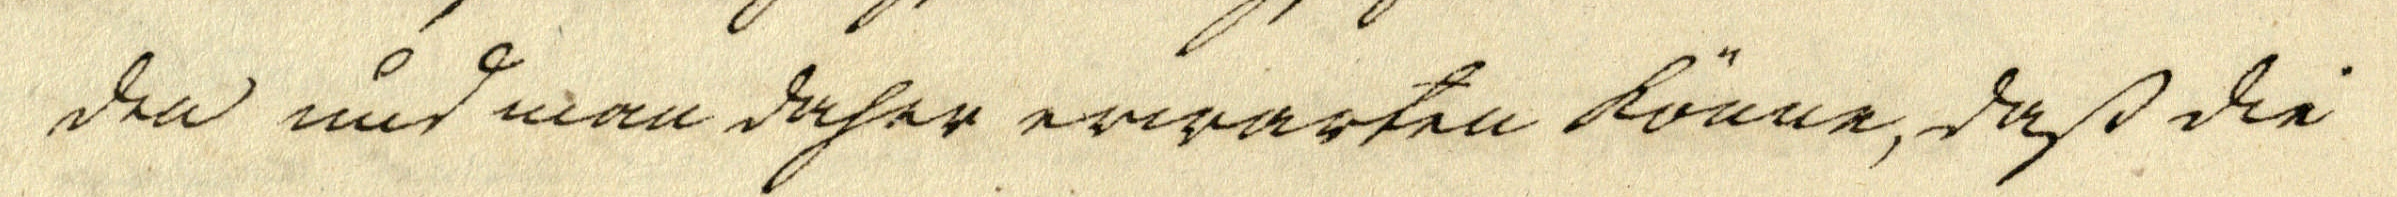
den und man daher erwarten könne, daß die
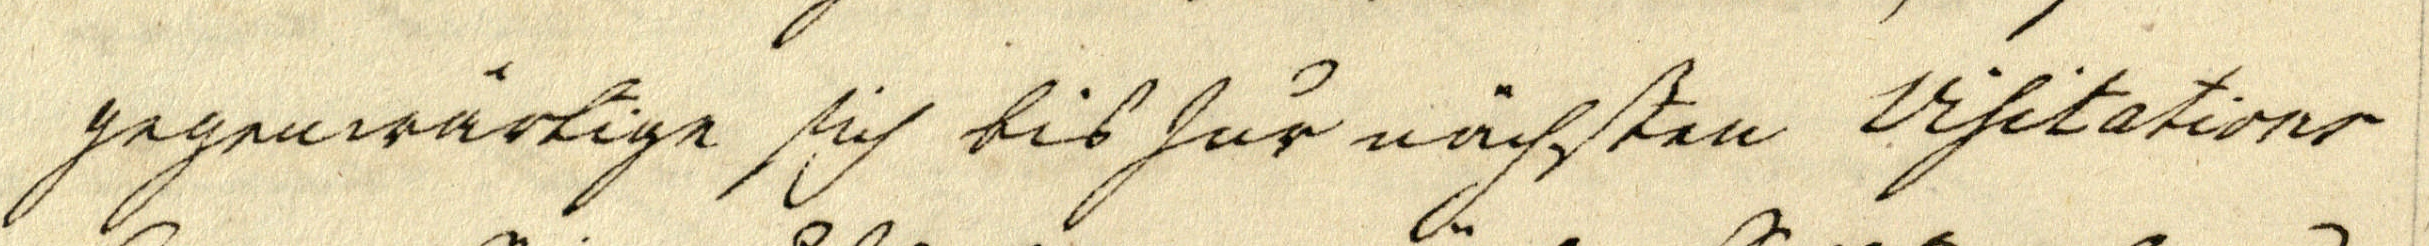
gegenwärtige sich bis zur nächsten Visitations
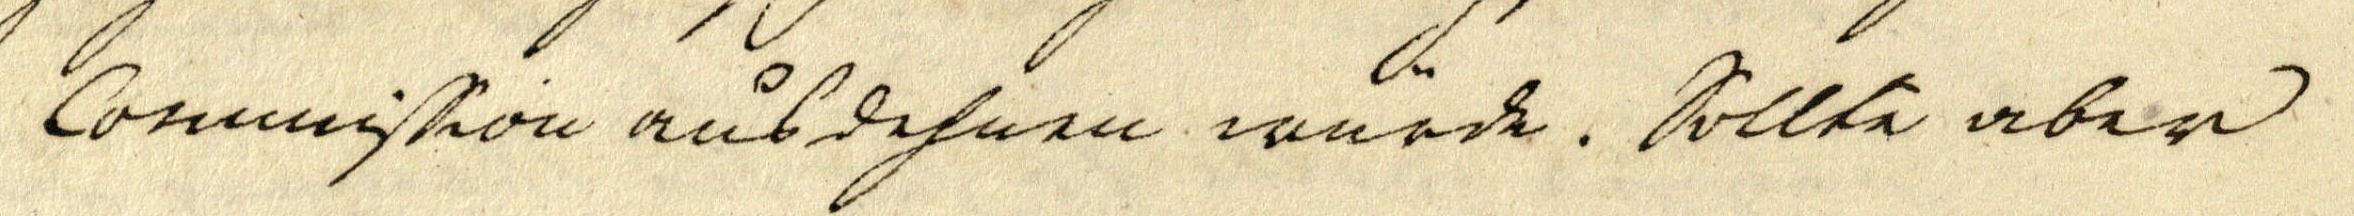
Commission ausdehnen würde. Sollte aber
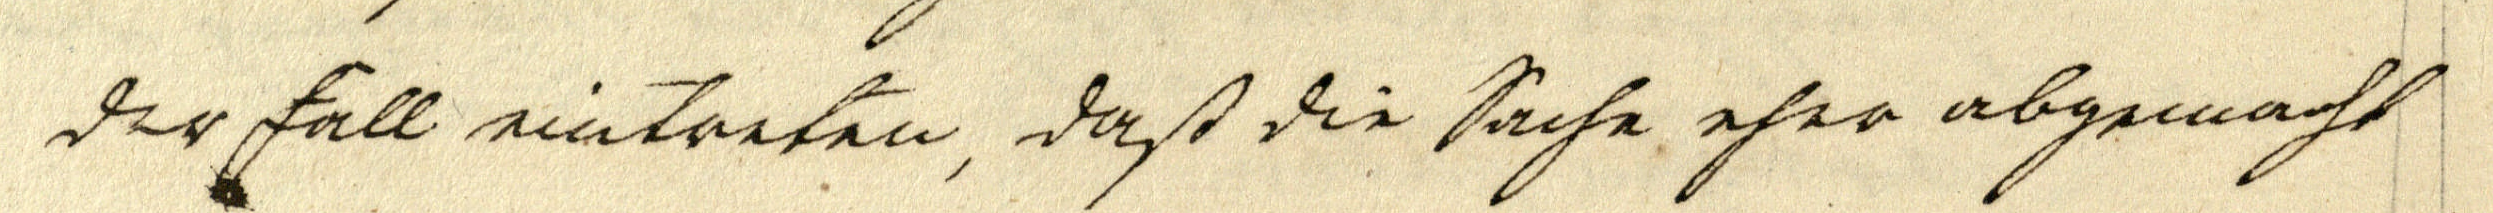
der Fall eintreten, daß die Sache eher abgemacht
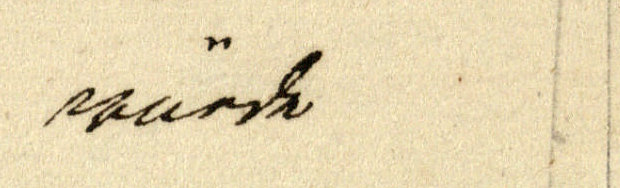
würde
